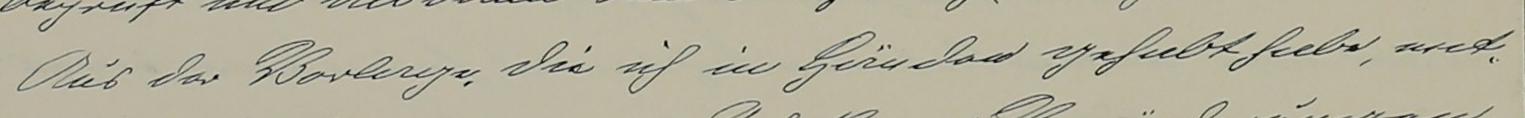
Aus der Vorlage, die ich in Händen gehabt habe, ent-
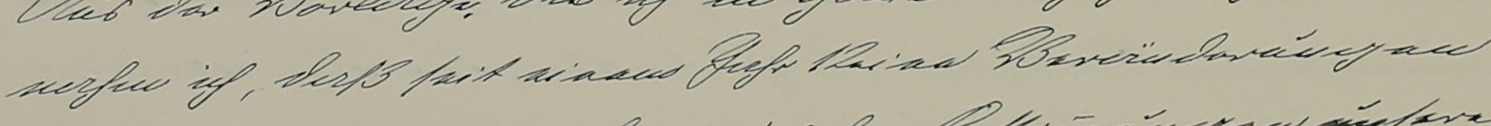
nahm ich, daß seit einem Jahr keine Veränderungen
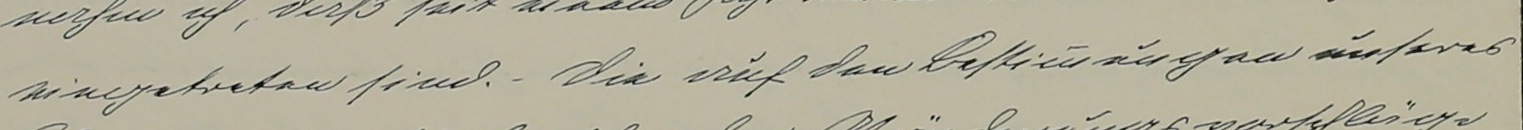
eingetreten sind. - Die auf den Bestimmungen unseres
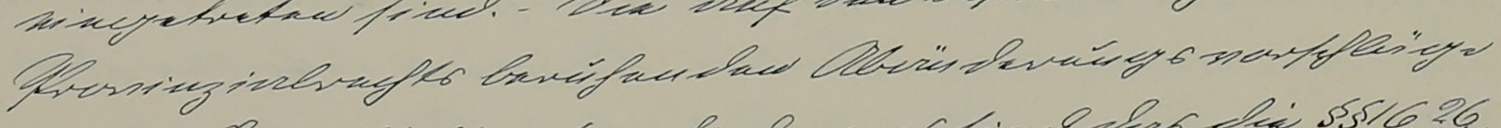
Provinzialrechts beruhenden Abänderungsvorschläge
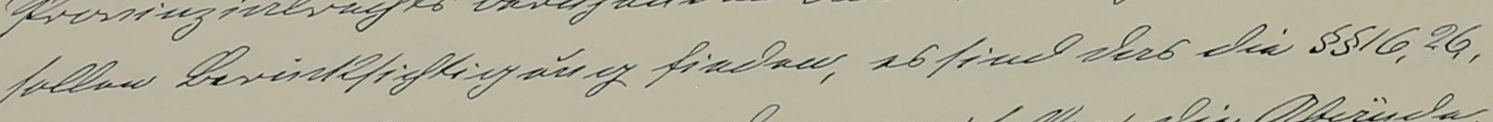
sollen Berücksichtigung finden, es sind das die §§16, 26,
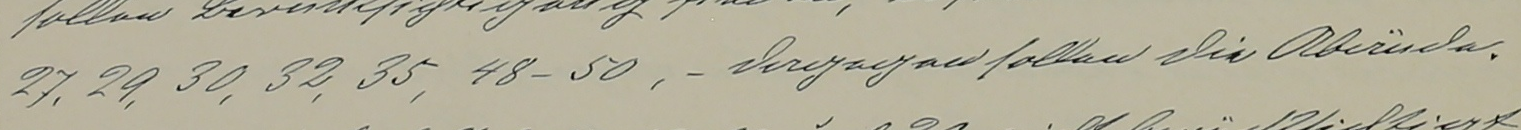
27, 29, 30, 32, 35, 48-50, - dagegen sollen die Abände-
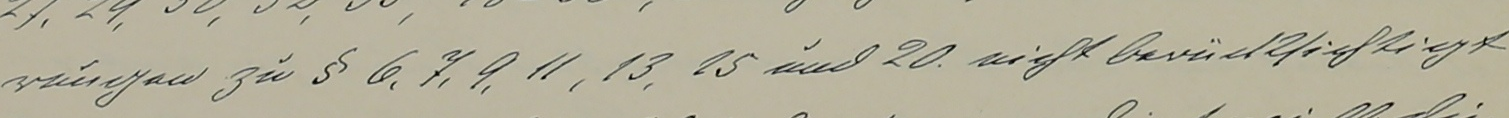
rungen zu § 6, 7, 9, 11, 13, 15 und 20. nicht berücksichtigt
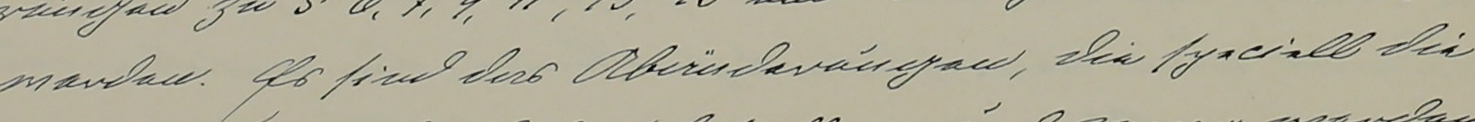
werden. Es sind das Abänderungen, die speciell die
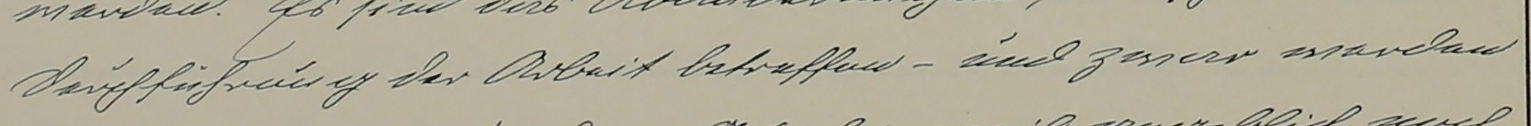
Durchführung der Arbeit betreffen – und zwar werden
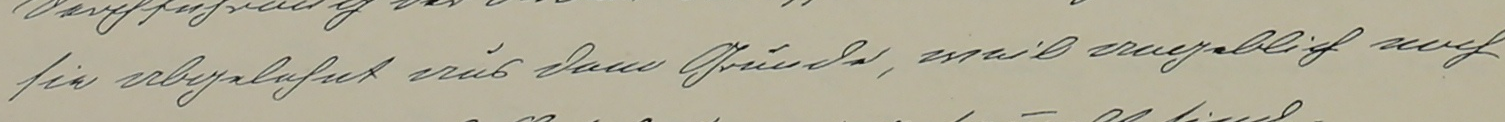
sie abgelehnt aus dem Grunde, weil angeblich noch
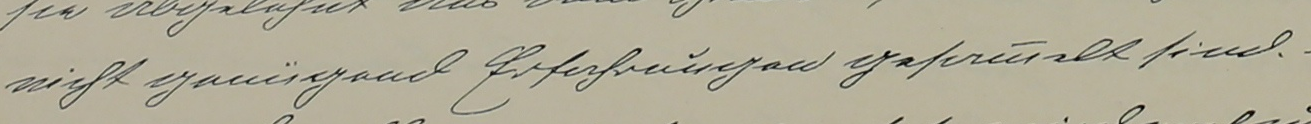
nicht genügend Erfahrungen gesammelt sind.
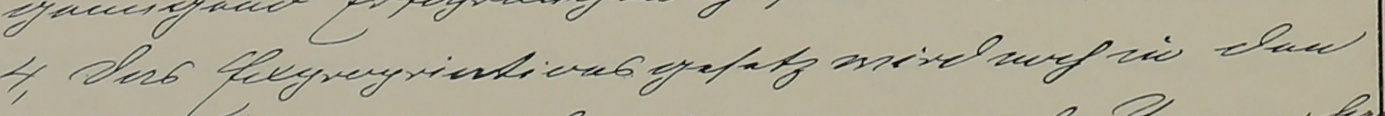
4. Das Expropriationsgesetz wird noch in den
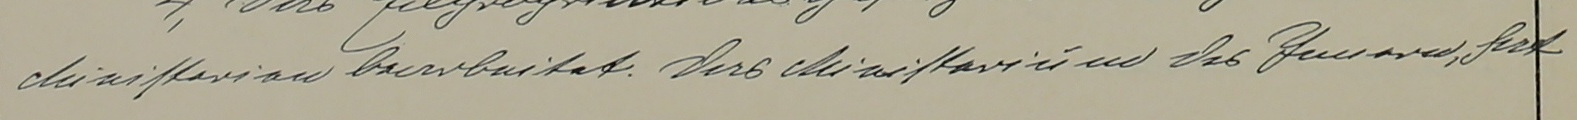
Ministerien bearbeitet. Das Ministerium des Innern, hat
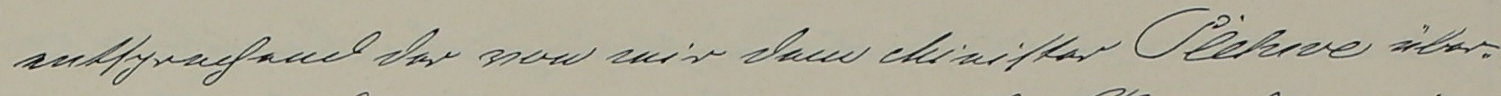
entsprechend der von mir dem Minister Plehwe über-
